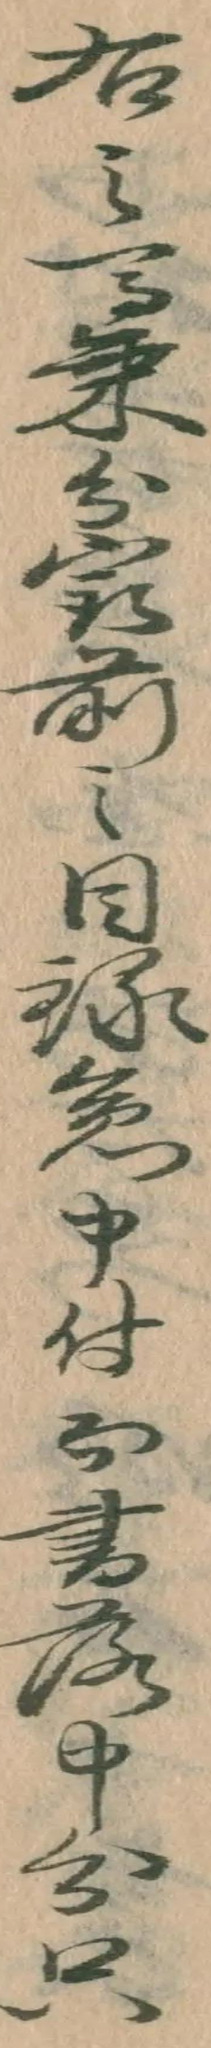右之馬乗分最前之目録急申付而書落申分只
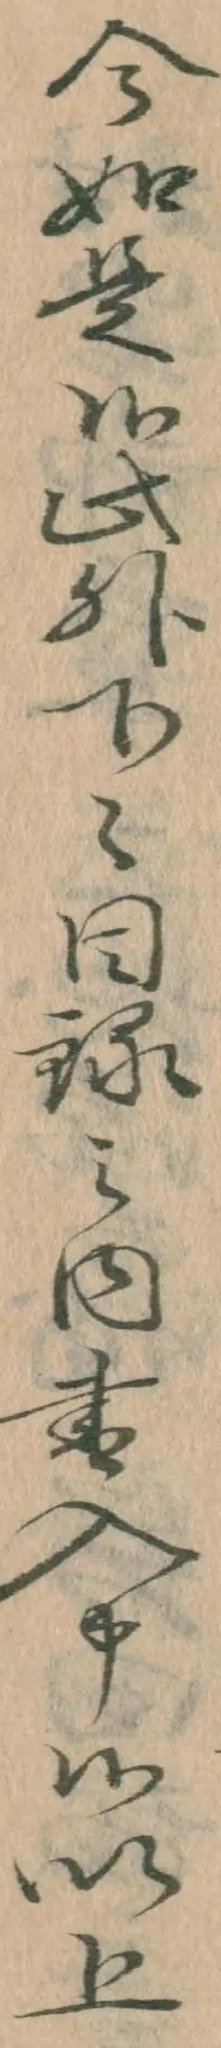今如是候此外下々目録之内書入申候以上
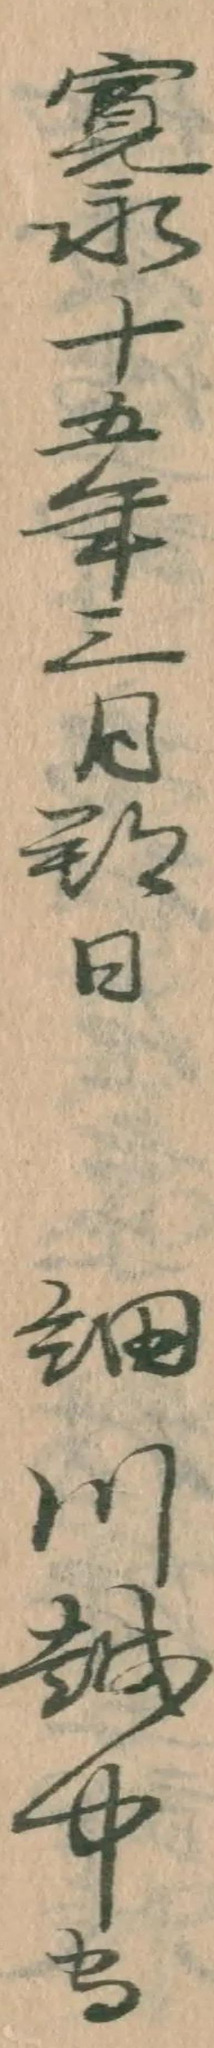寛永十五年三月朔日細川越中守
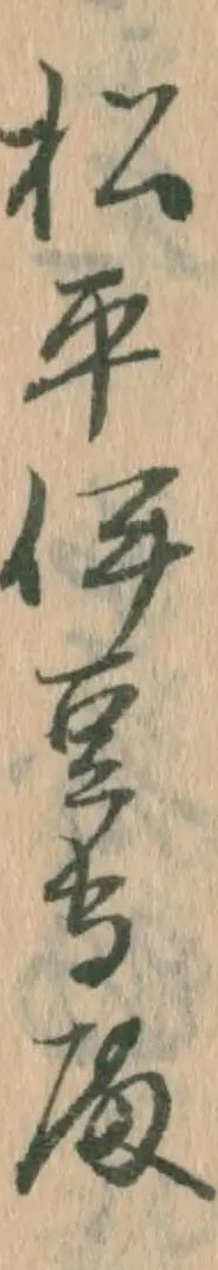松平伊豆守殿
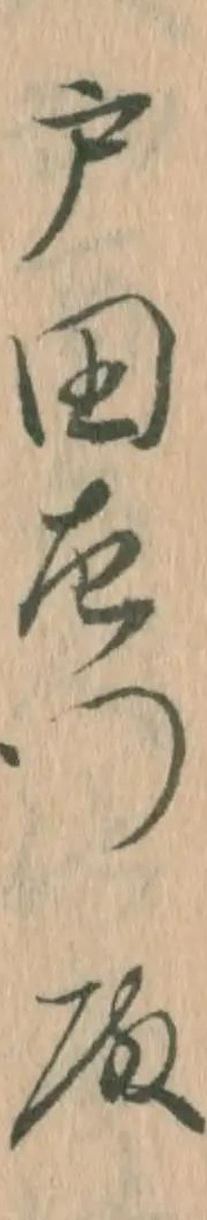戸田左門殿
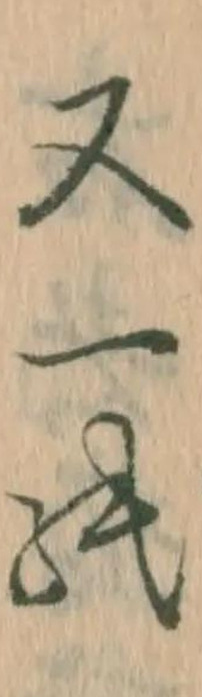又一紙
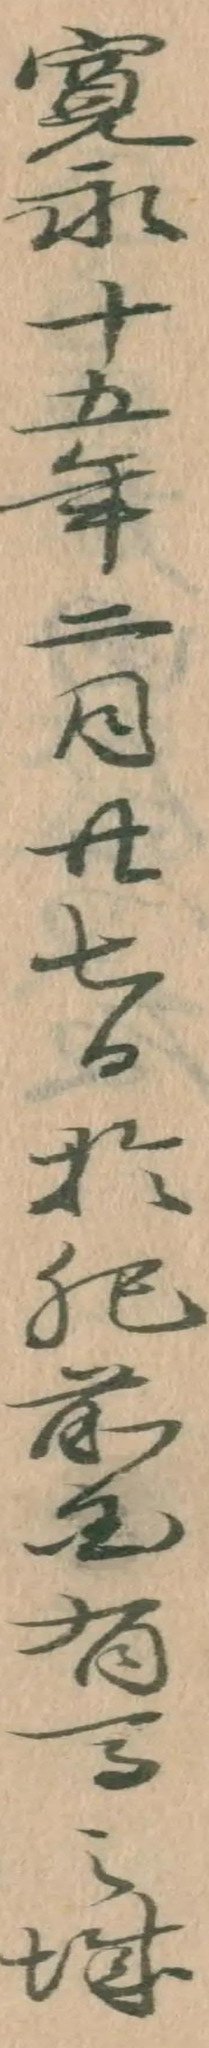寛永十五年二月廿七日於肥前国有馬之城
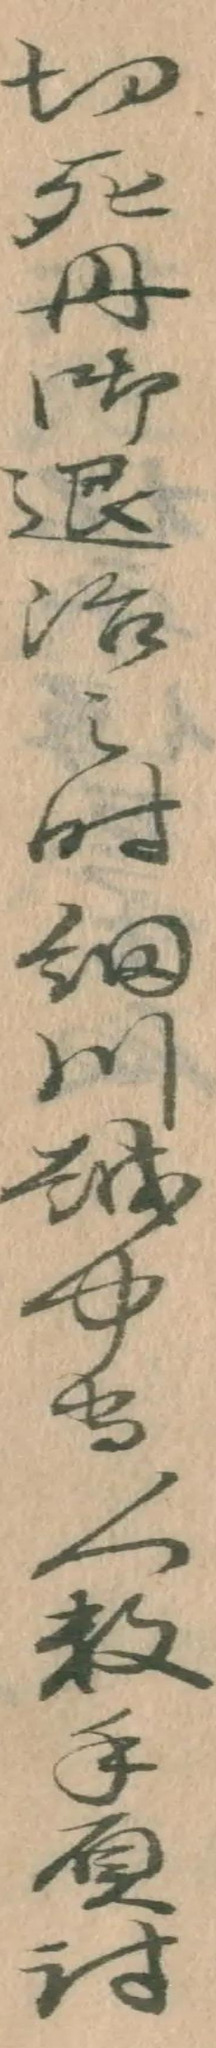切支丹御退治之時細川越中守人数手負討
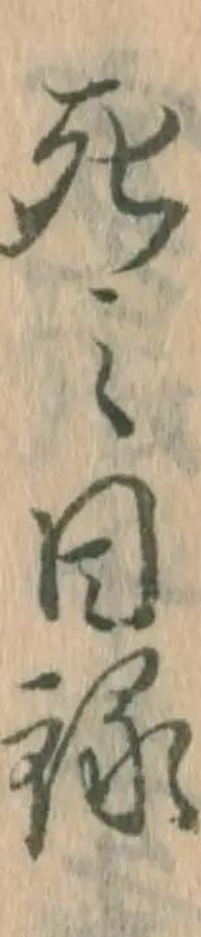死之目録
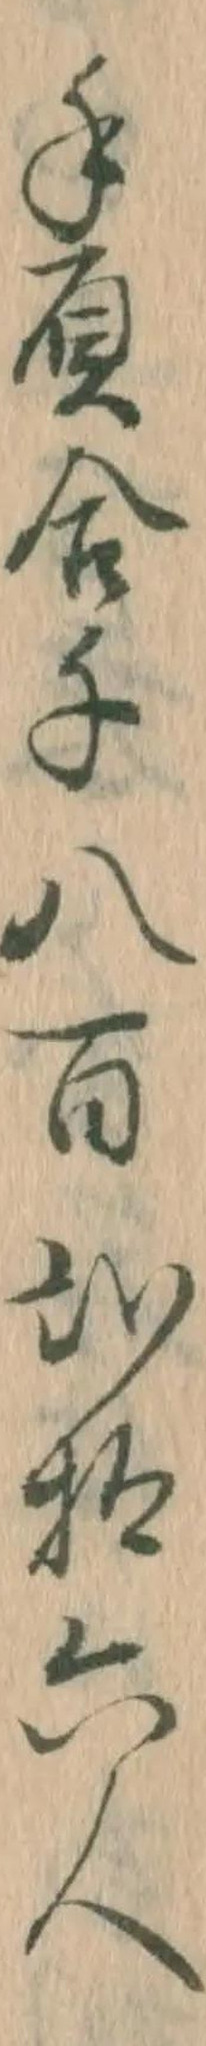手負合千八百弐拾六人
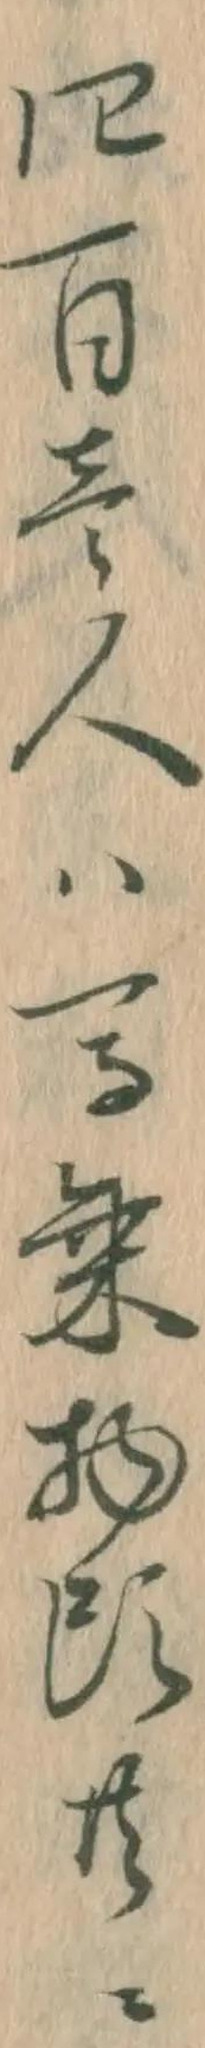四百壱人は馬乗物頭共に
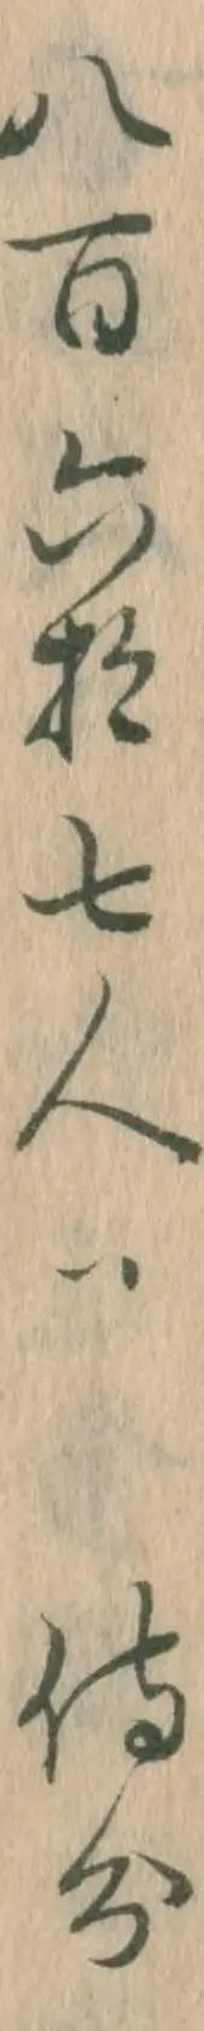八百六十七人は侍分
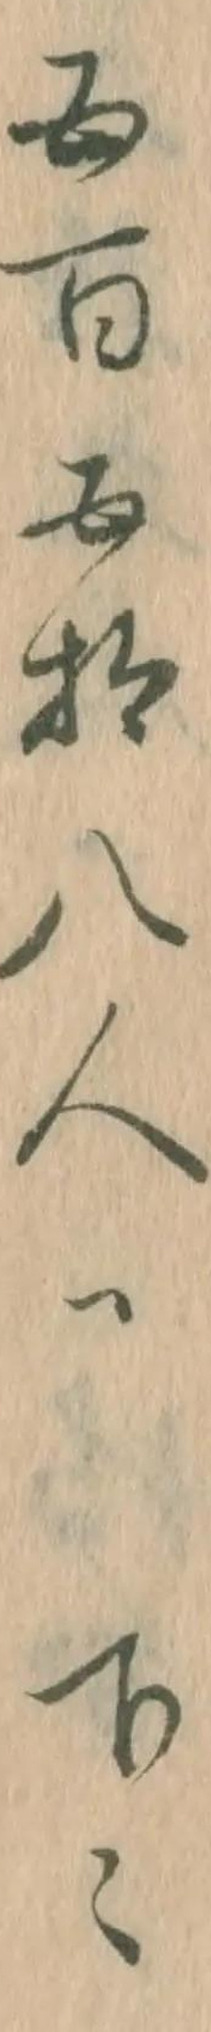五百五拾八人は下々
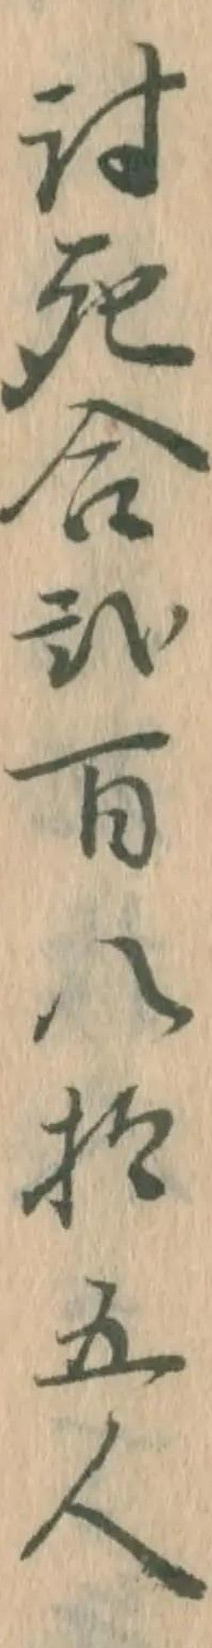討死合弐百八拾五人

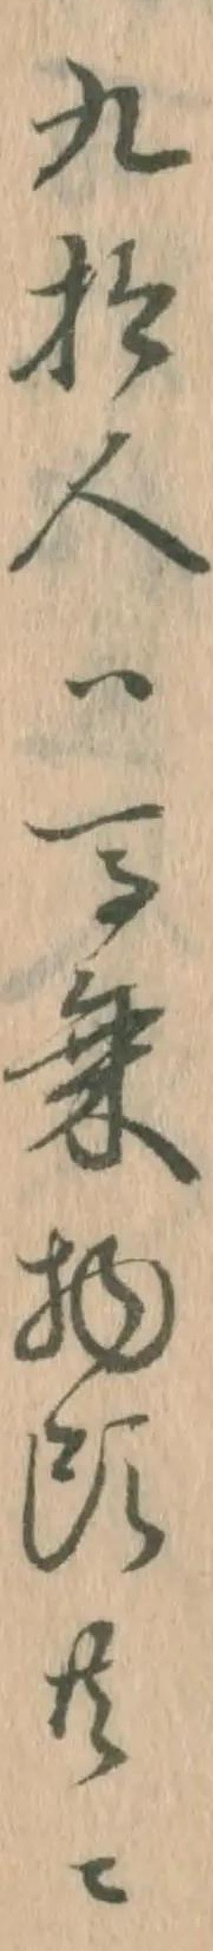九拾人は馬乗物頭共に
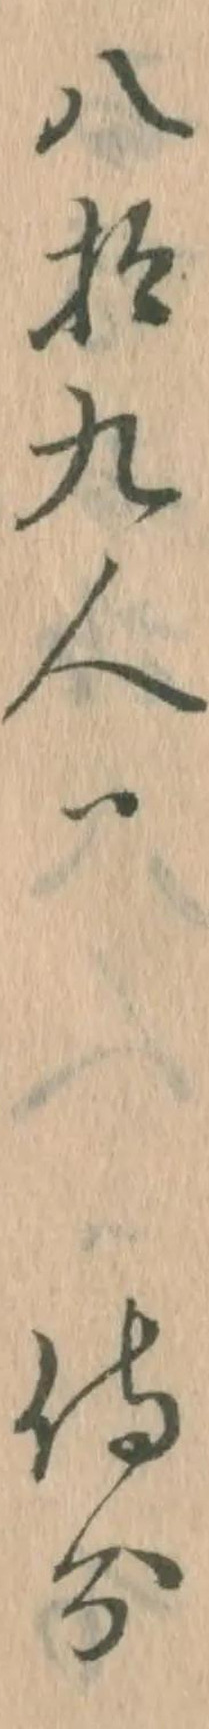八拾九人は侍分
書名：切支丹御退治記 49巻. [9]
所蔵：国立国会図書館 National Diet Library, JAPAN
